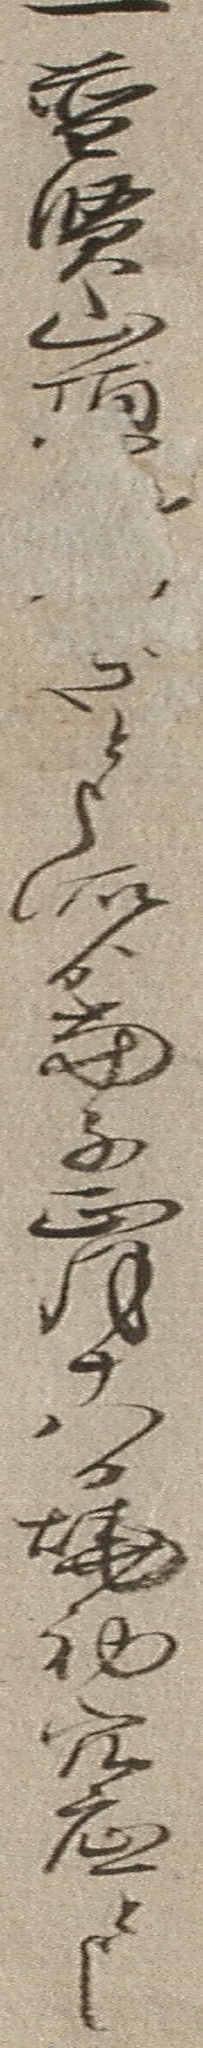一普賢山頂と申所ゟ当子正月十八日焼初穴底と申
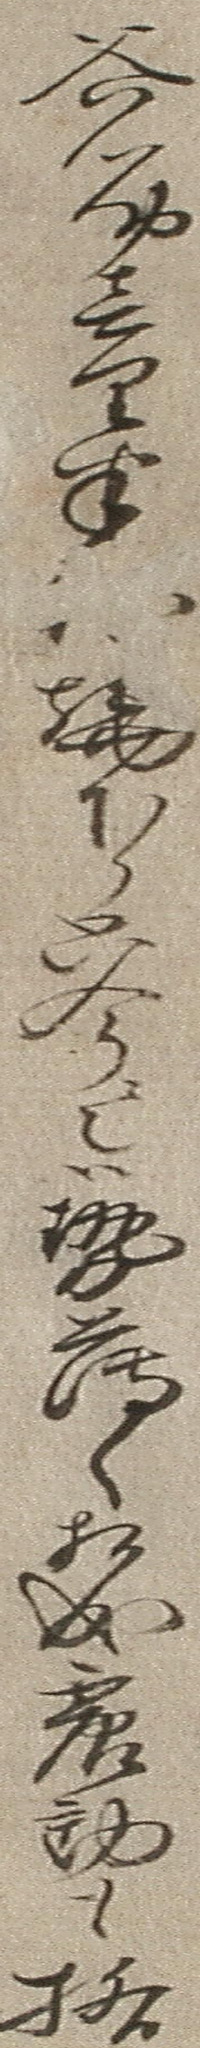谷筋壱里半程焼下り只今に而は勢薄く相成震動も格
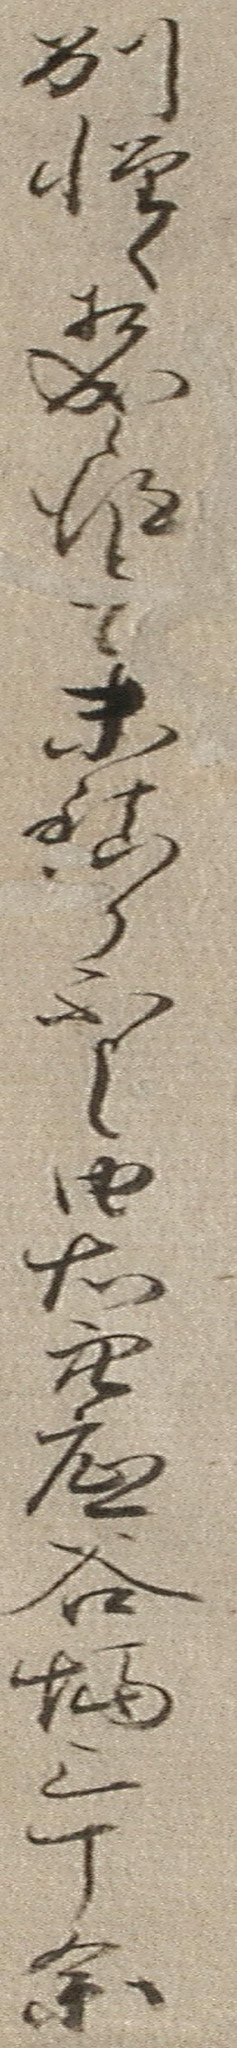別軽く相成候得とも未鎮り不申候由右穴底谷幅三十余
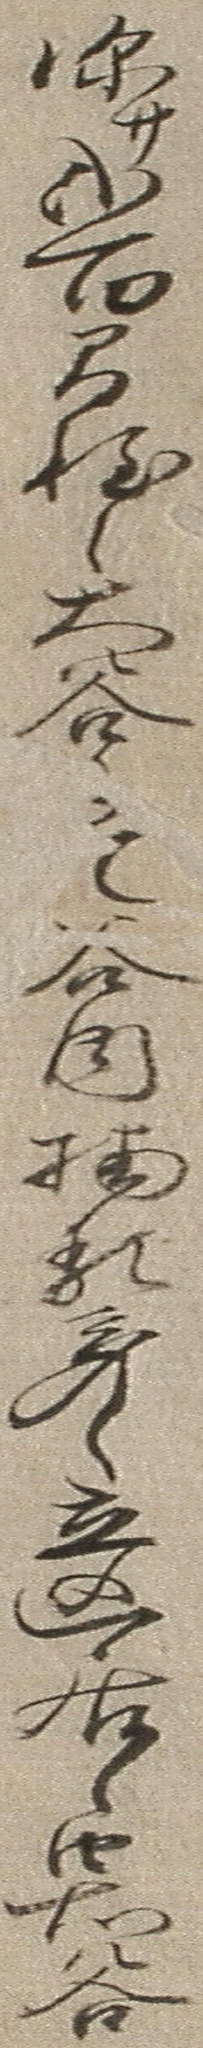深さ弐百間程之大谷にて谷内楠類多く立込居候由右谷
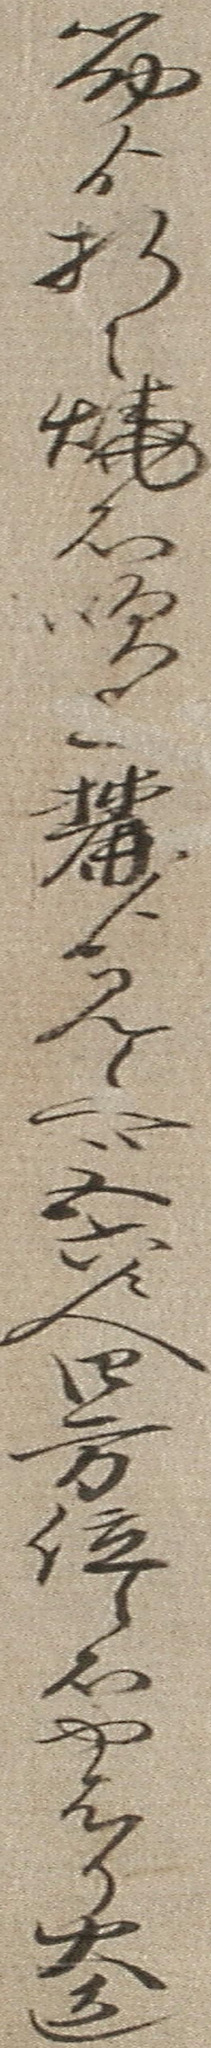筋ゟ折々焼石吹上麓ゟ見候へは五六尺四方位之石やはり火辺
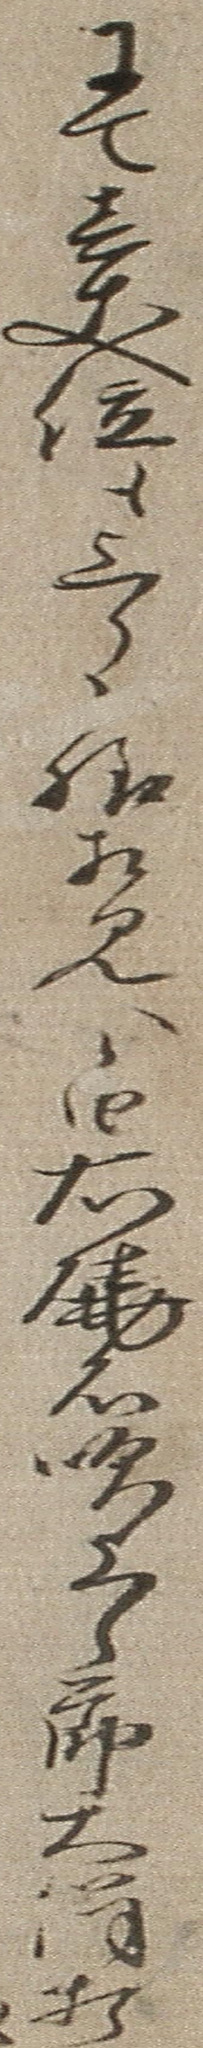にて壱丈位も上り候様相見へ候由右焼石吹上候節大筒打候
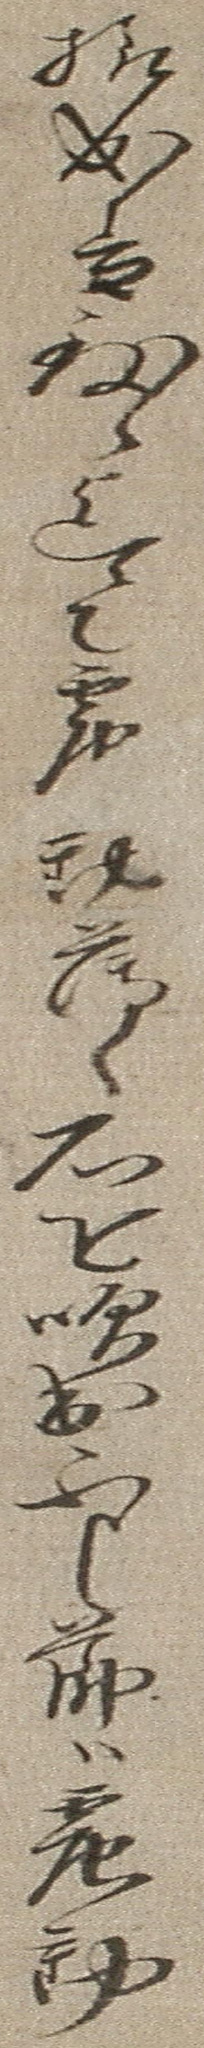様成音致候迄にて震動薄く石を吹出不申候節は震動
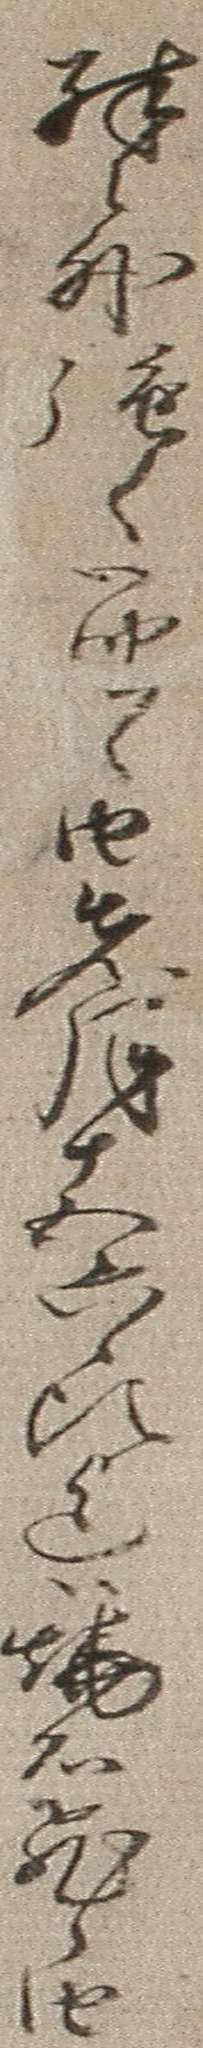殊之外強く御座候由先月十五六日頃迄は焼石飛候由
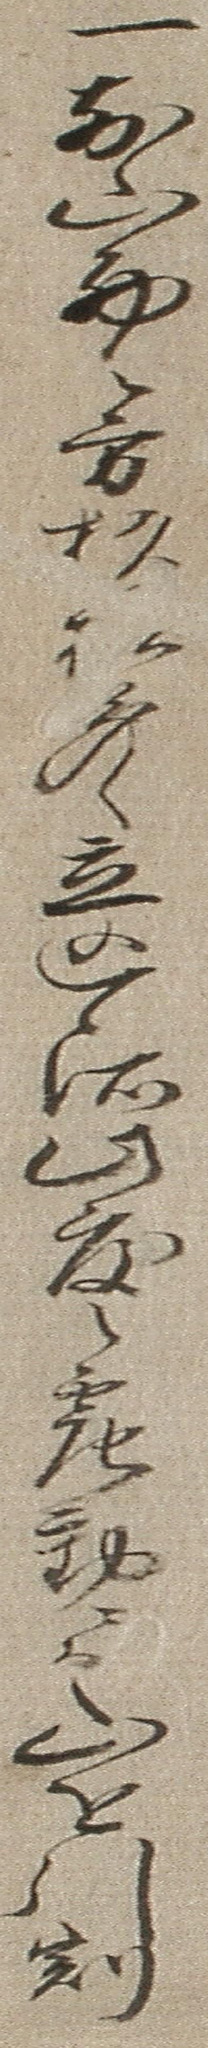一前山西之方杉松多く立込候所此度之震動に而山を引割
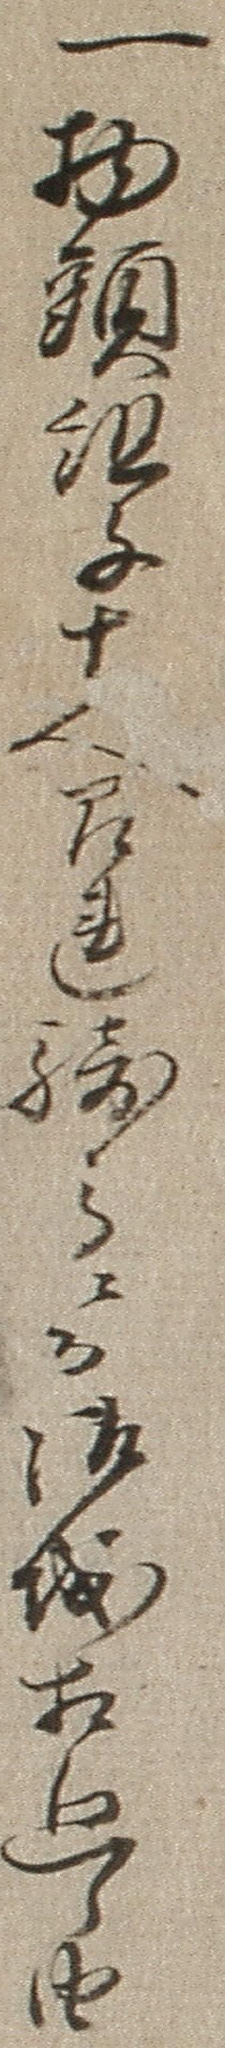一物頭組子十人召連騎馬に而御城相廻候由
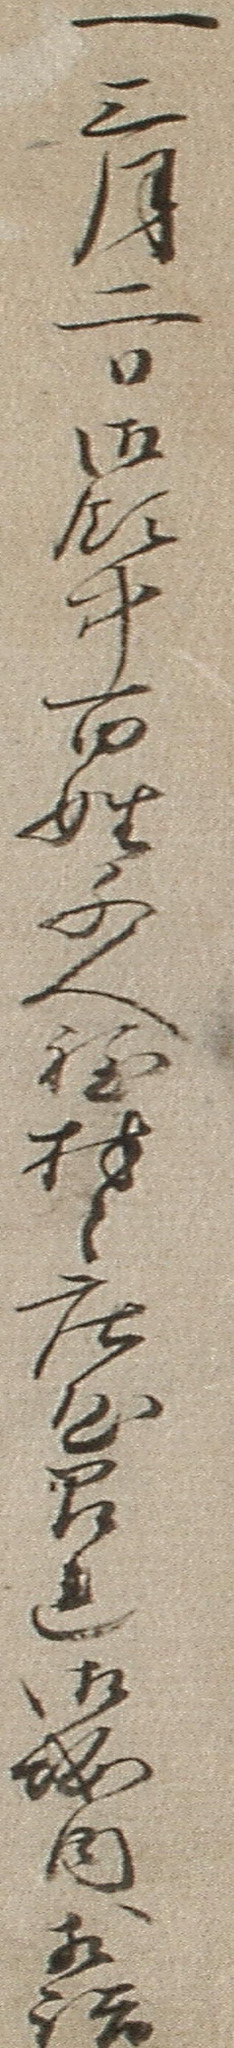一三月二日御領中百姓千人程村々庄屋召連御城内へ相詰
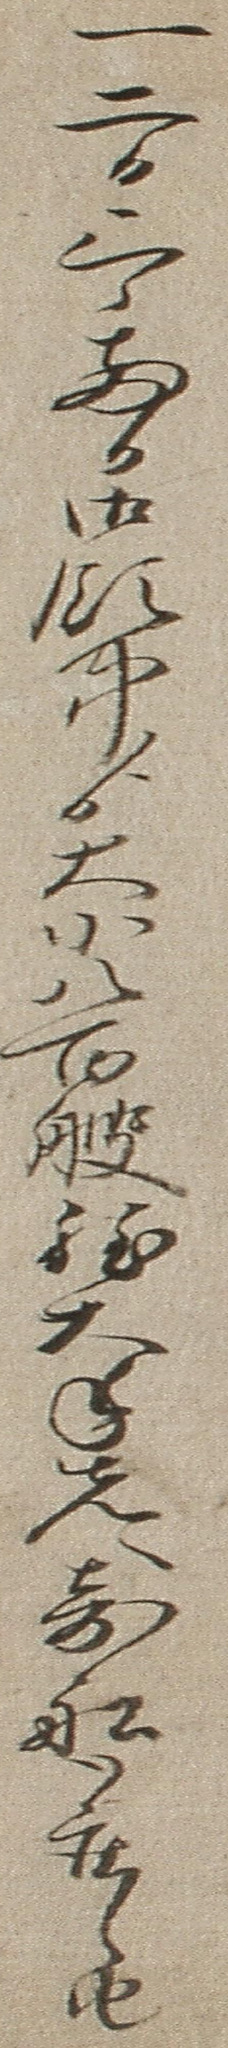一二日三日両日御領中ゟ大小八百艘程大手先へ寄船御座候由

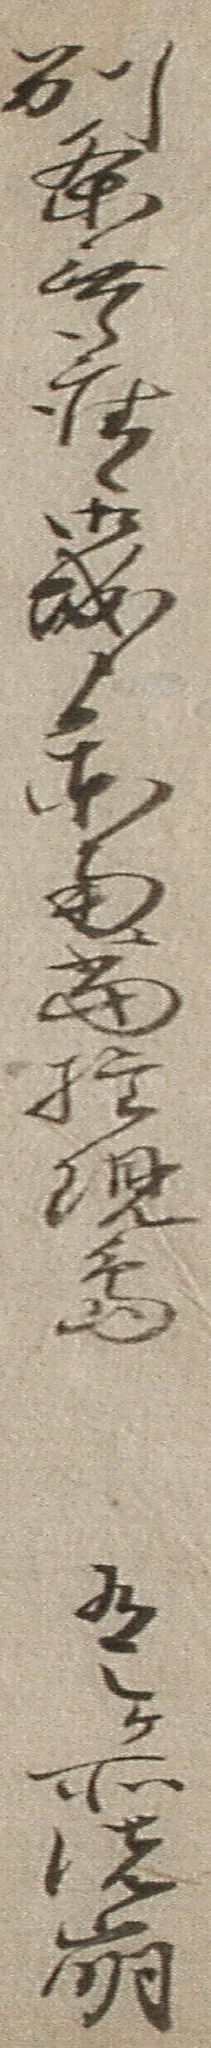別条無御座候御城ゟ東南に当権現嶋有之ヶ所洗崩
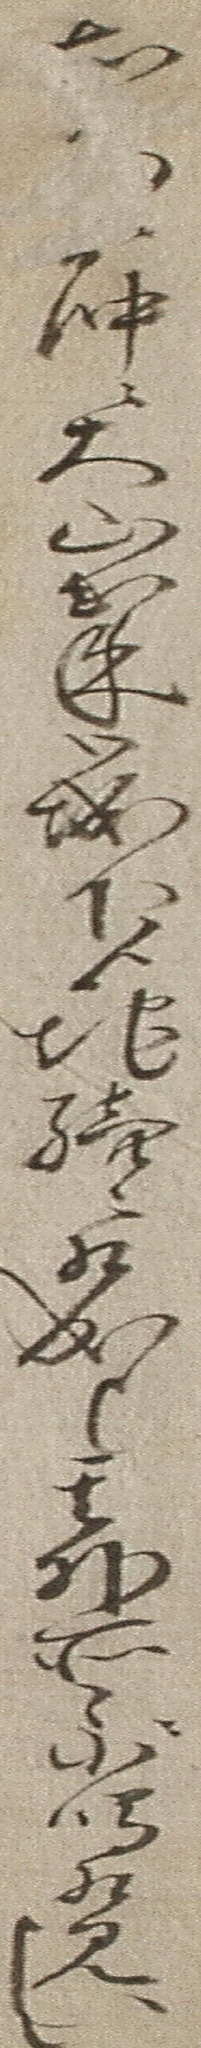右沖に大山出来御城下ゟ地続に相成申候其外所々に小嶋相見へ申候
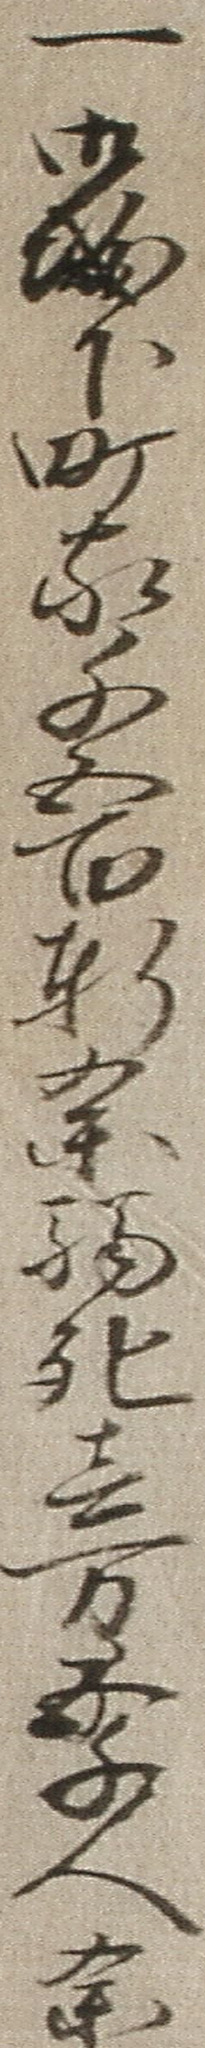一御城下町家千五百軒余溺死壱万五千人余
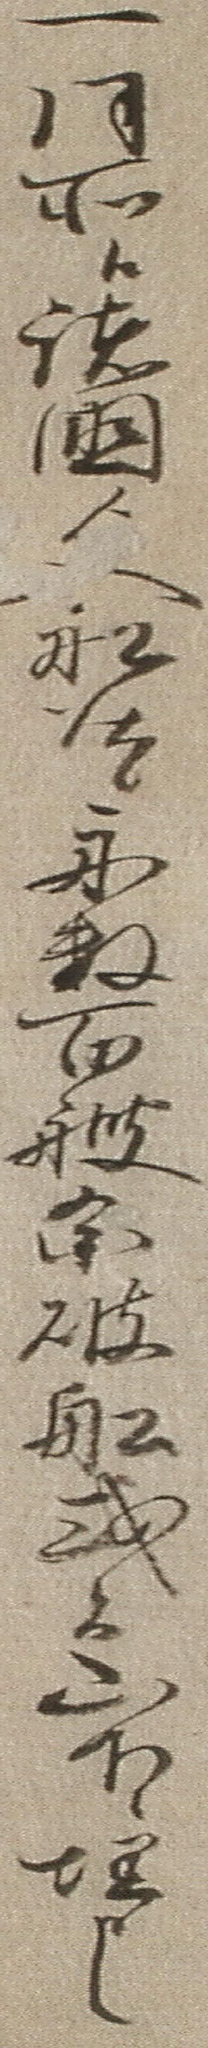一同所江諸国ゟ入船仕候船数百艘余破船或は山下へ埋申候
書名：太平秘録抜書　浅間山燒及普賢山崩
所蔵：東京大学地震研究所図書室 Earthquake Research Institute Library, The University of Tokyo, JAPAN
